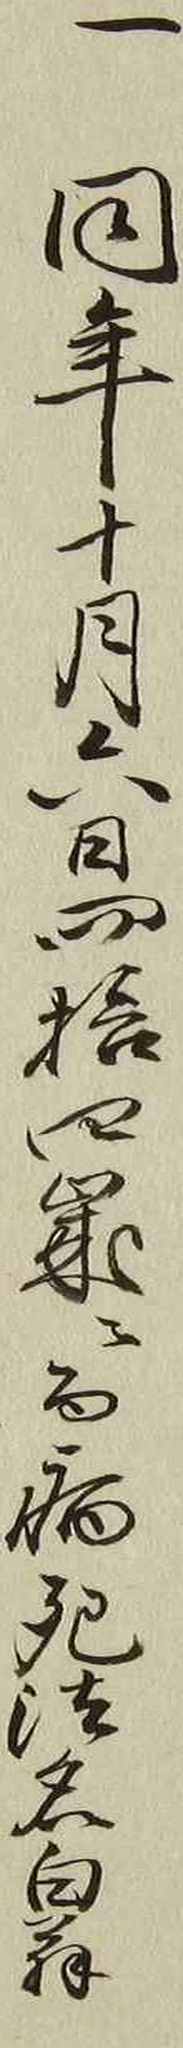一同年十月六日四拾四歳ニ而病死法名白翁
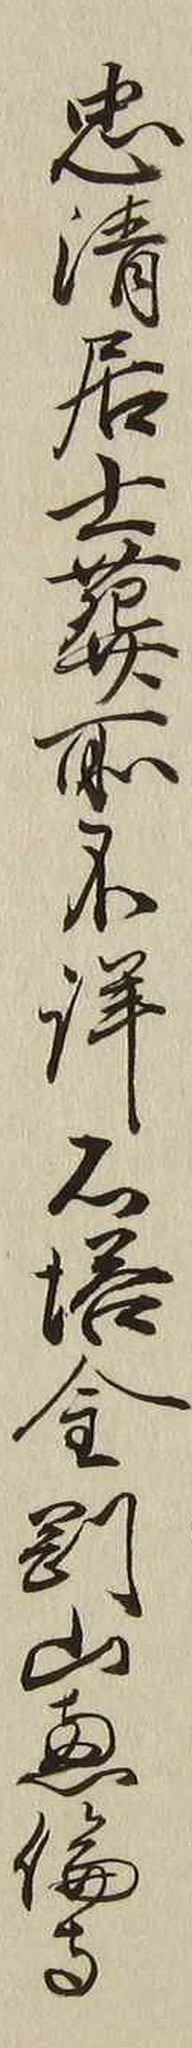忠清居士葬所不詳石塔金剛山恵倫寺
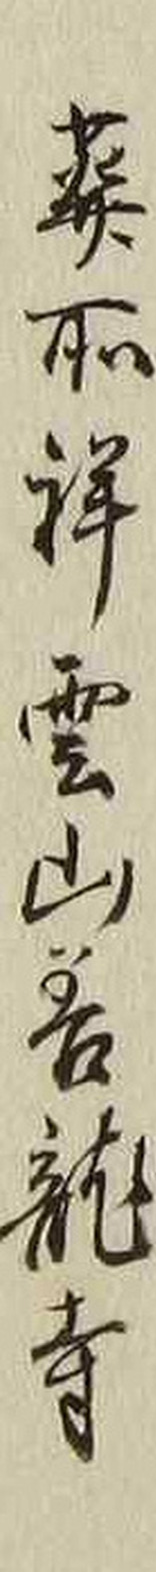葬所祥雲山善龍寺

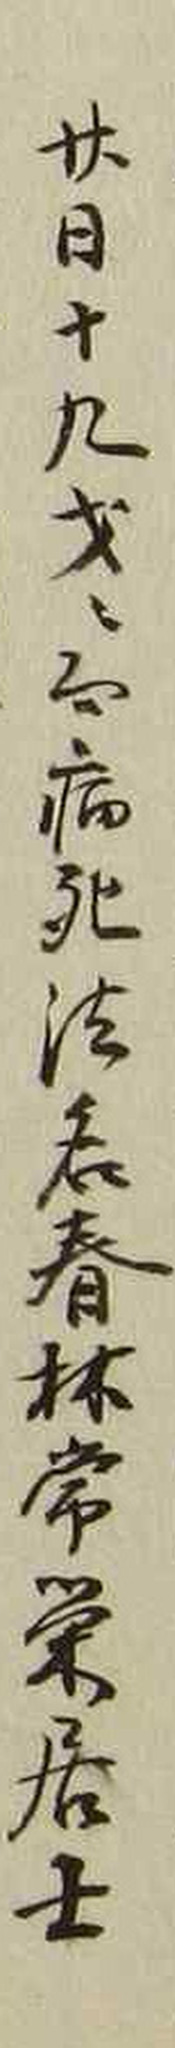母同上廿日十九才ニ而病死法名春林常栄居士
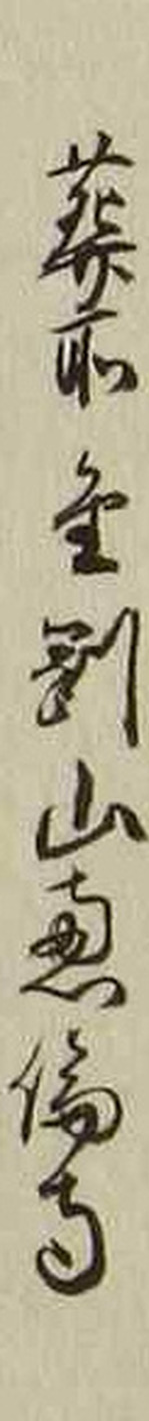葬所金剛山恵倫寺
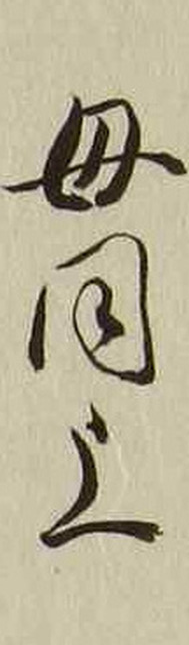母同上
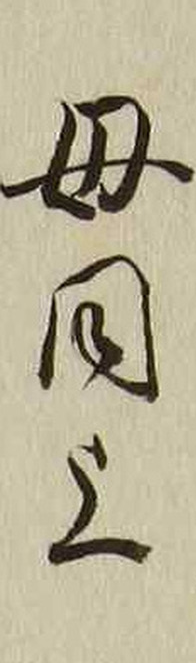母同上
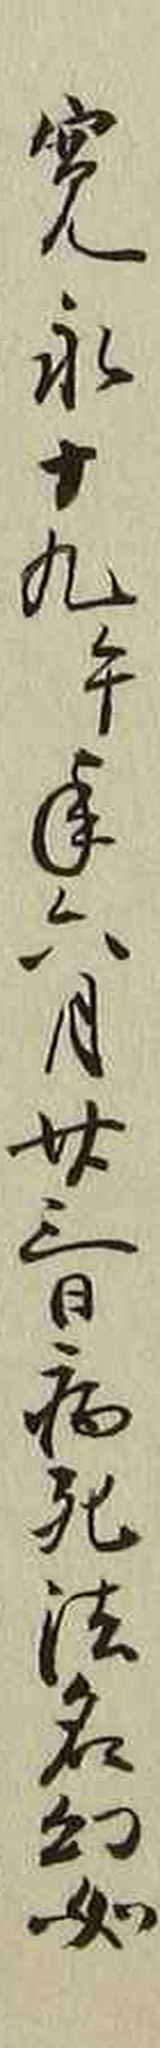女寛永十九午年六月廿三日病死法名幻女
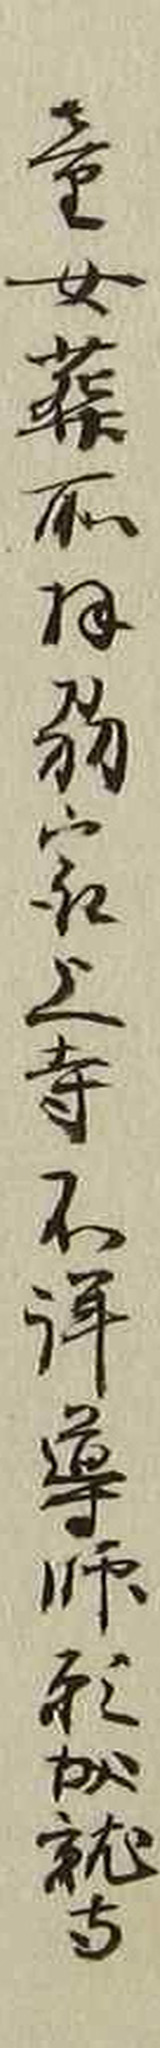母同上童女葬所羽州最上寺不詳導師願成就寺
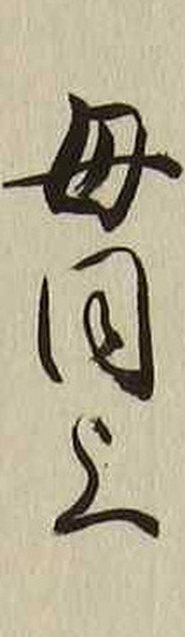母同上
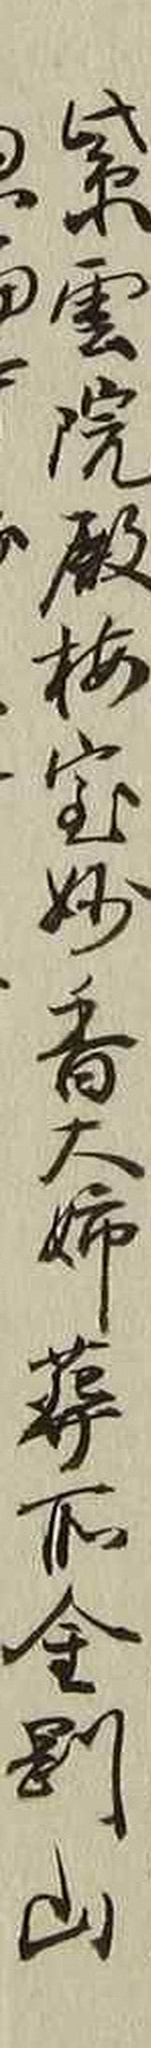紫雲院殿梅宝妙香大姉葬所金剛山
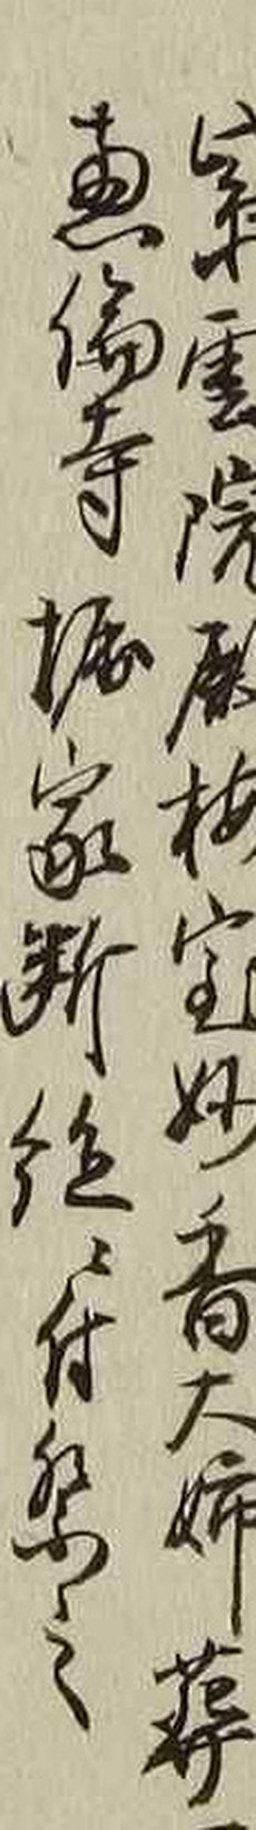恵倫寺堀家断絶ニ付祭之
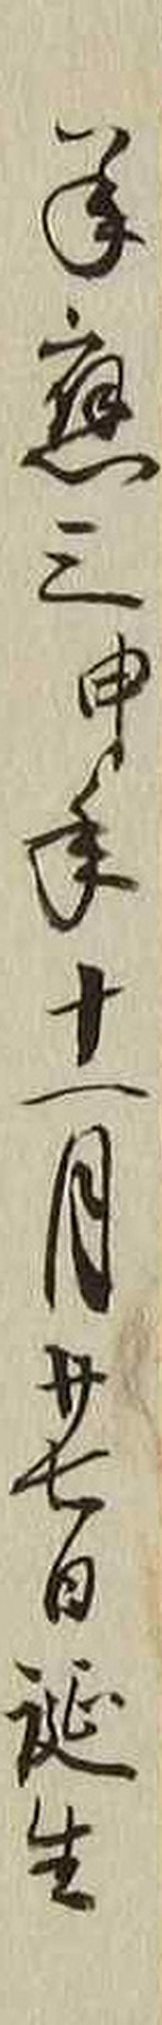承応三申年十一月廿七日誕生
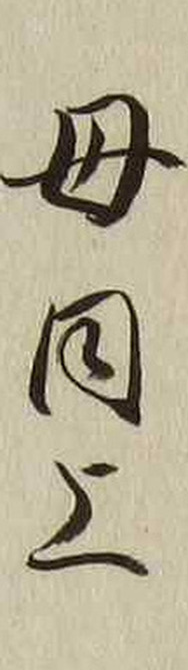母同上
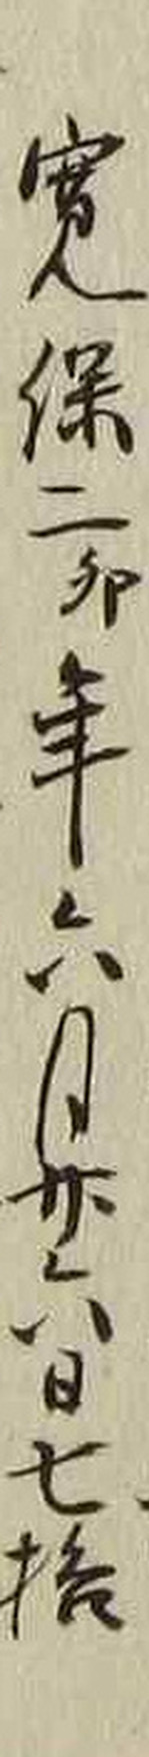寛保二卯年六月廿六日七拾
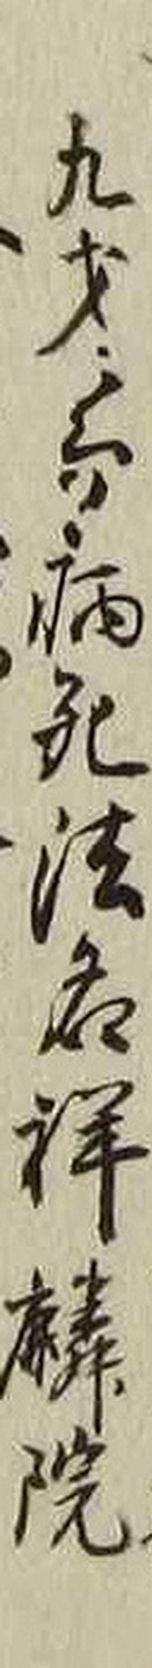九才ニ而病死法名祥麟院
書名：諸士系譜　巻之21　い之部21
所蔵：会津若松市立会津図書館
